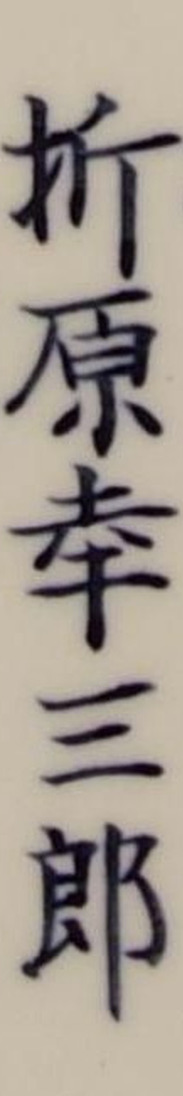折原幸三郎
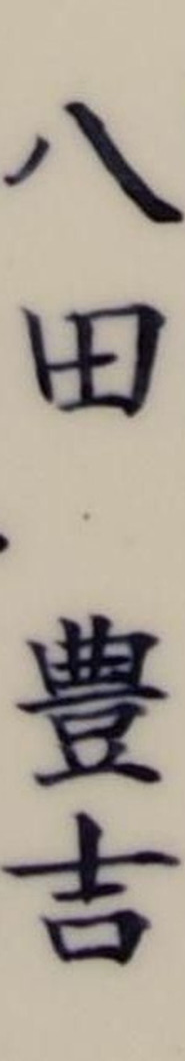八田豊吉
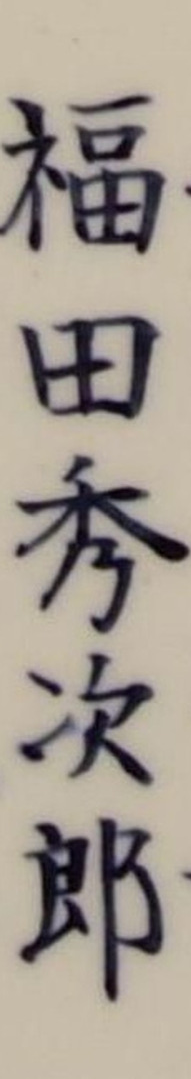福田秀次郎
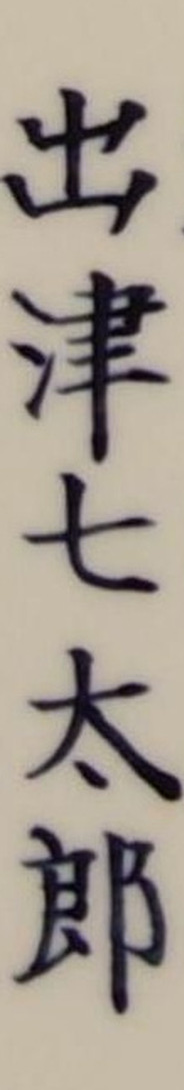出津七太郎
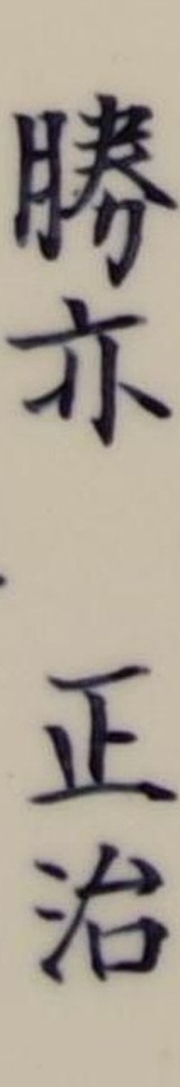勝亦正治
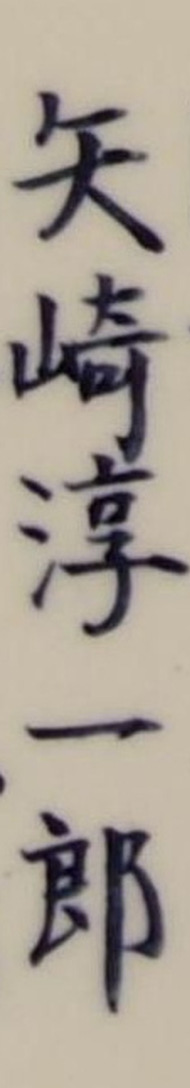矢崎淳一郎
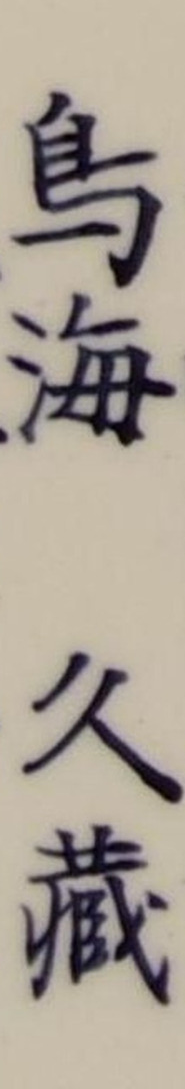鳥海久蔵
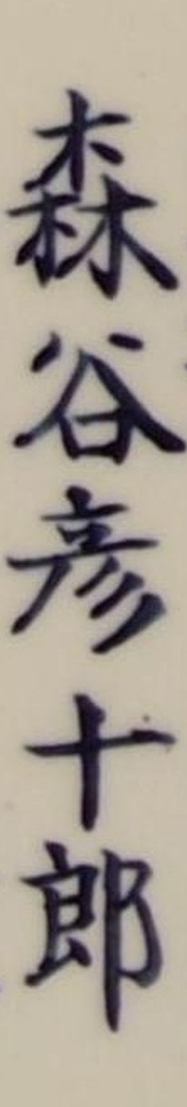森谷彦十郎
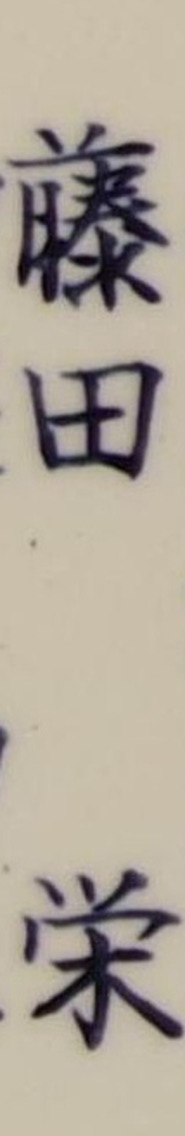藤田栄
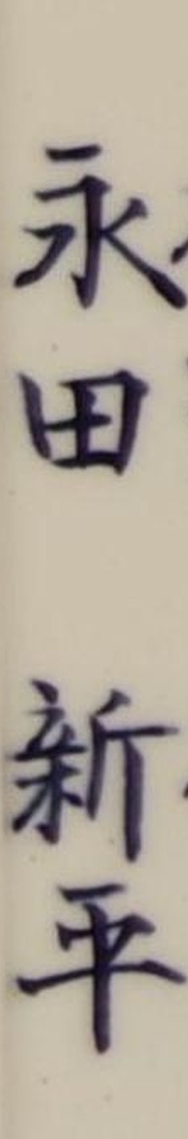永田新平

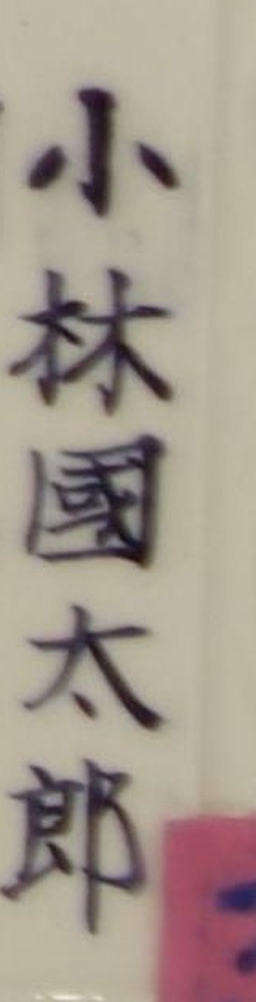小林國太郎
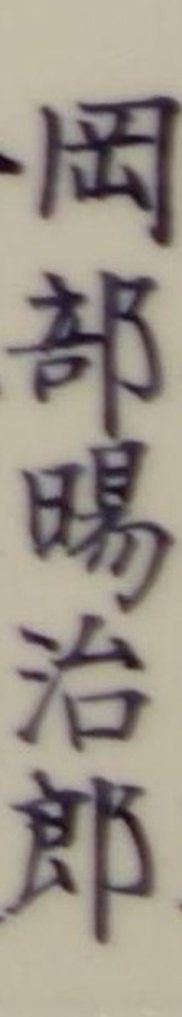岡部晹治郎
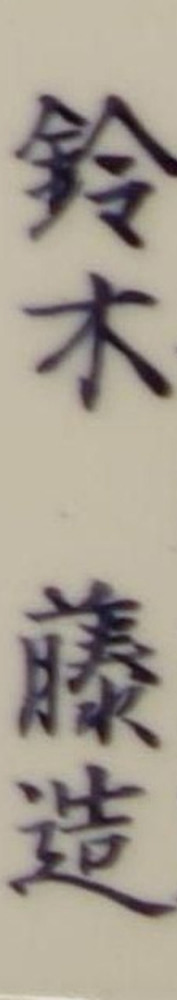鈴木藤造
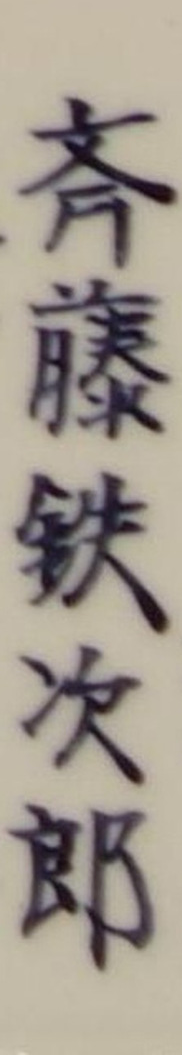斉藤鉄次郎
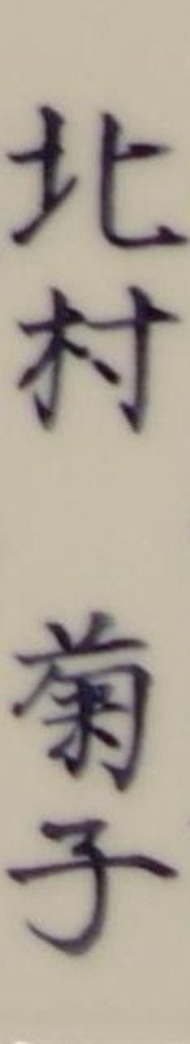北村菊子
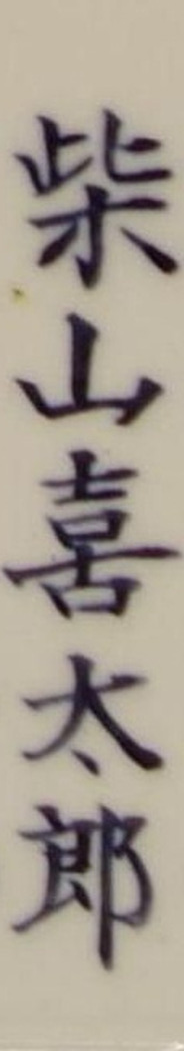柴山喜太郎
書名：E~L
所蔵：高野山金剛峯寺
